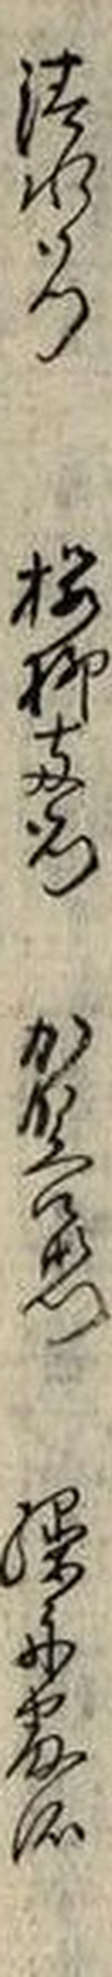清水御門桜柳両御門加賀口御門繰舟番所
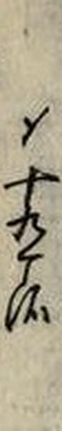〆十九ケ所
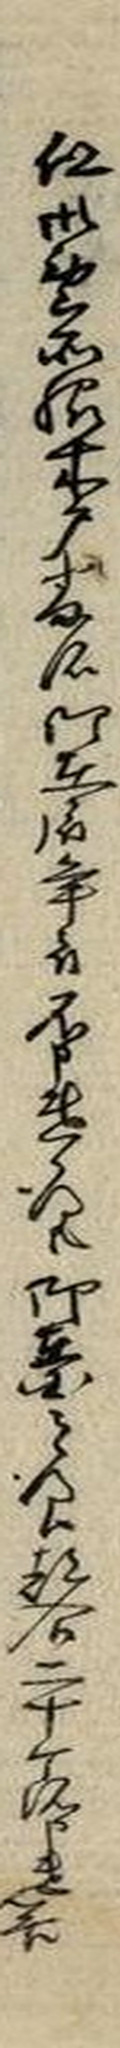但御台所脇木戸番所御在府年に付不申遣候得共御在国に候得は都合二十ケ所申遣候筈
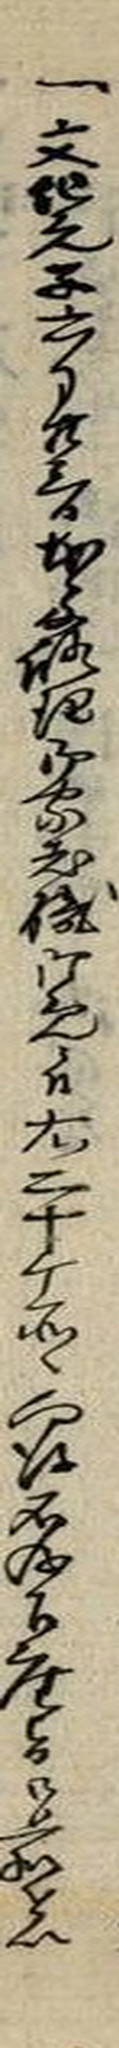一文化元子六月廿三日本多修理御家老職御免に付右二十ケ所へ向後不及下座旨口上扣を以
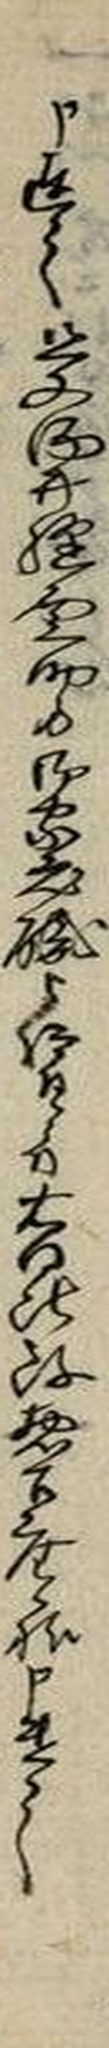申達之且又酒井縫殿助方御家老職被仰付候に付右同断致惣下座候様申遣之
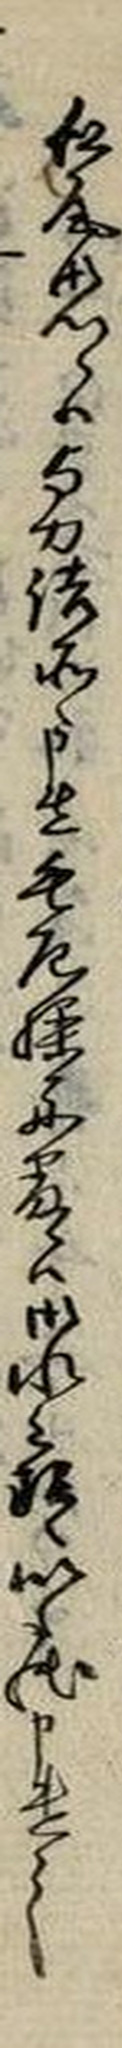但瓦御門へは与力詰所へ申遣毛屋繰舟番へは御水主頭へ以手紙申遣之
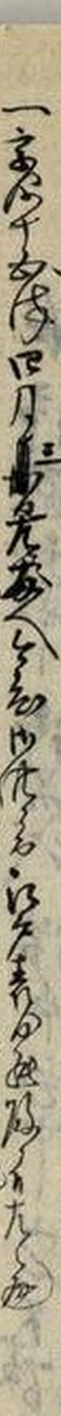一享保十五戌四月三日左之番人今度御供に而江戸表ゟ罷帰候に付左之通
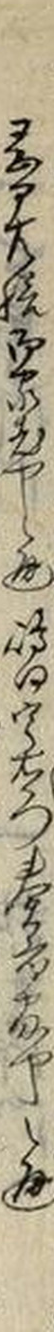岡部左膳御家老中之通嶋田宇右衛門奏者番中之通
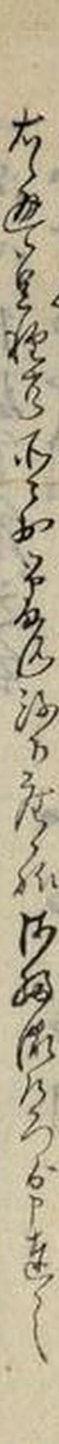右之通御足軽共所々於御番所致下座候様海福瀬左衛門ゟ申達之
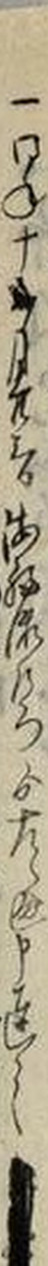一同年十月廿三日海福瀬左衛門ゟ左之通申達之
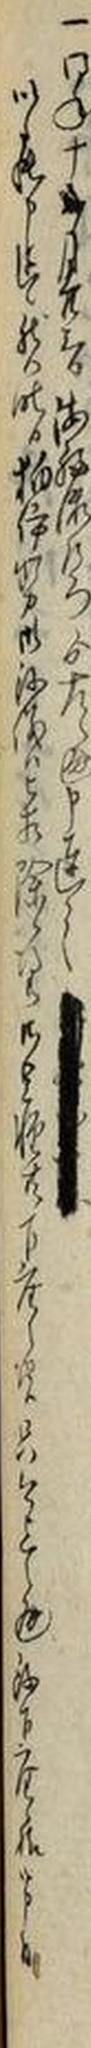以手紙申達候然は昨日狛伊勢御役儀は被相除候得共御足軽共へ下座候儀は今迄之通致下座候様被申付
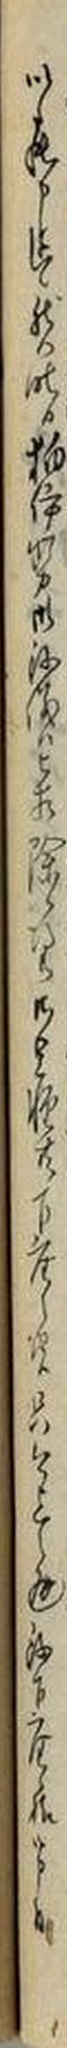以手紙申達候然は昨日狛伊勢御役儀は被相除候得共御足軽共へ下座候儀は今迄之通致下座候様被申付
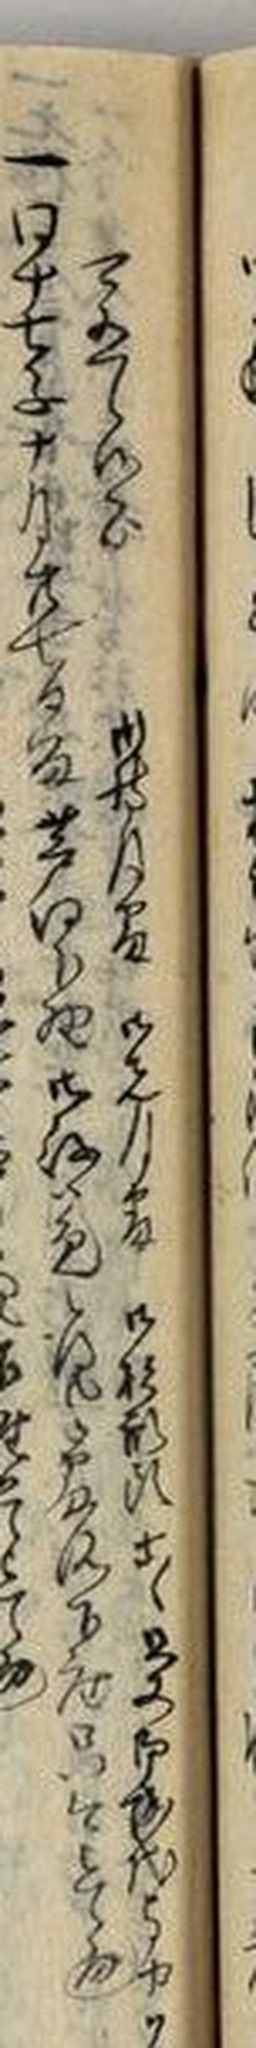一同十七子十月廿七日留芦田下野御役御免候得共御番所下座只今迄之通
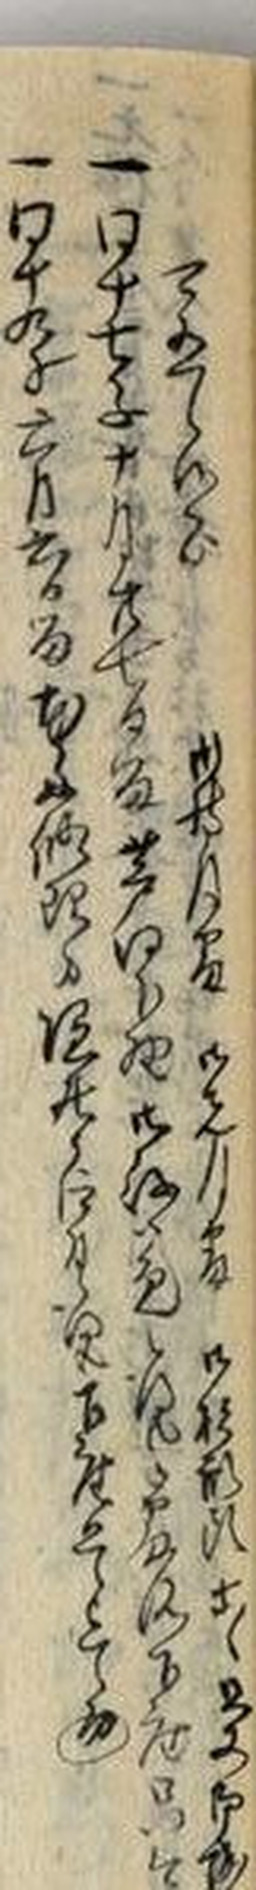一同十九寅六月六日留本多修理方隠居被仰付候得共下座只今迄之通

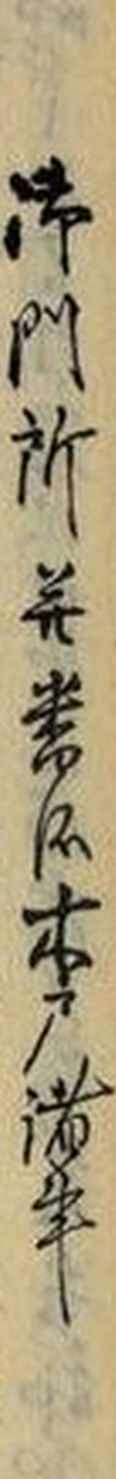御門所并番所木戸諸事
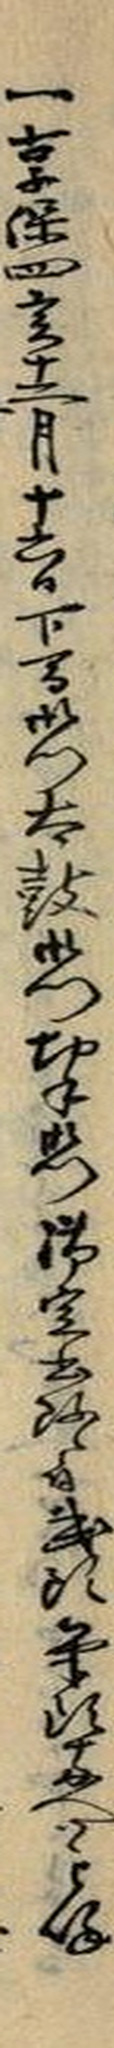一享保四亥十二月十六日下馬御門太鼓御門切手御門御定書改候に付武頭筆頭両人つゝ被呼
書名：御門御櫓之部
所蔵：福井県文書館 Fukui Prefectural Archives
